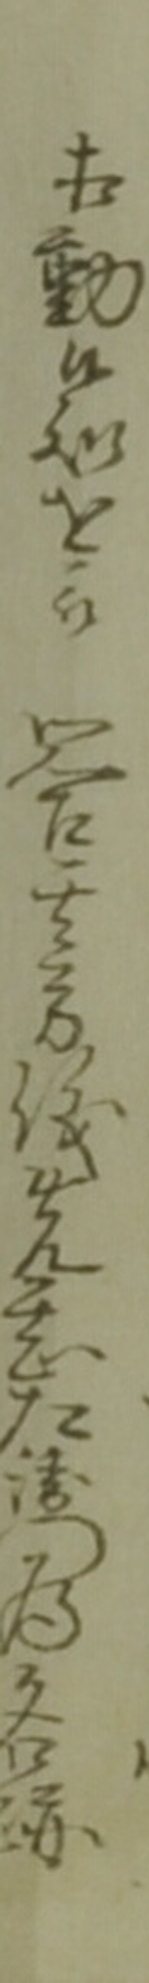相勤候処を被思召其方儀先甚左衛門為名跡
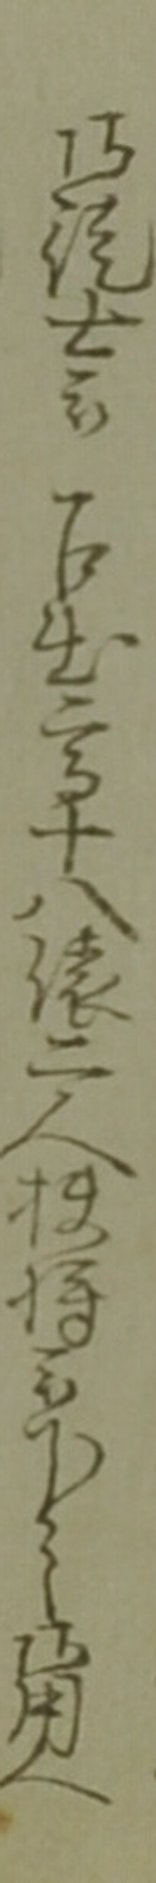御徒士被召出高十八俵二人扶持被下之御用人
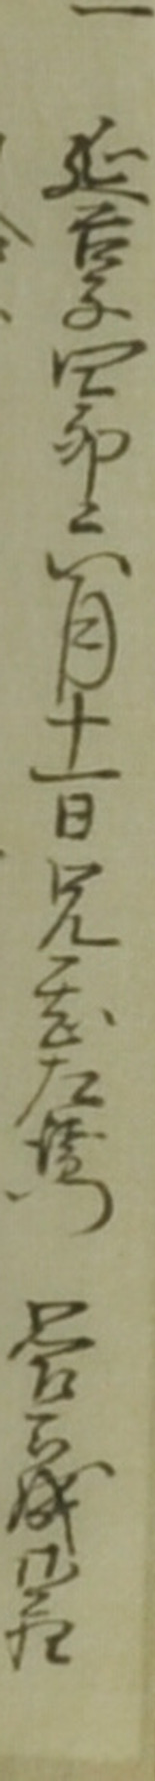一延享四卯六月十一日兄甚左衛門思召被成御座
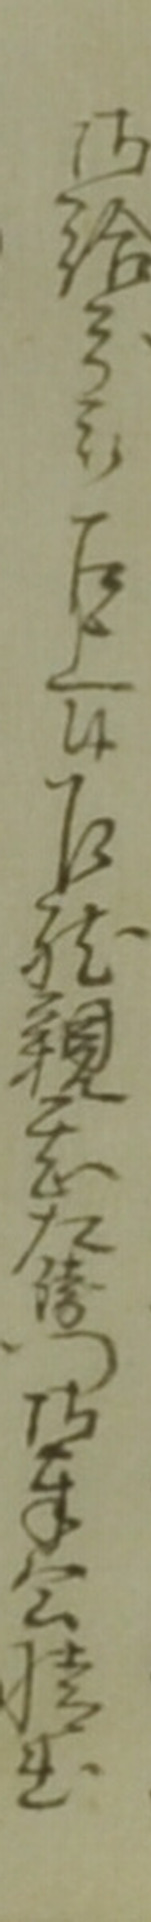御給分被召上候乍然親甚左衛門御奉公情出
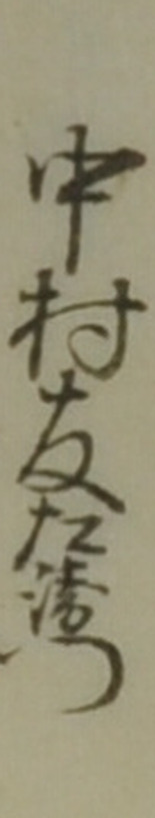中村友左衛門
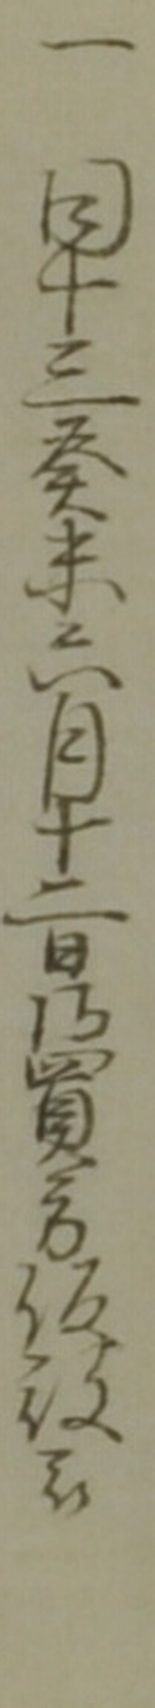一同十三癸未六月十二日御買方仮役被
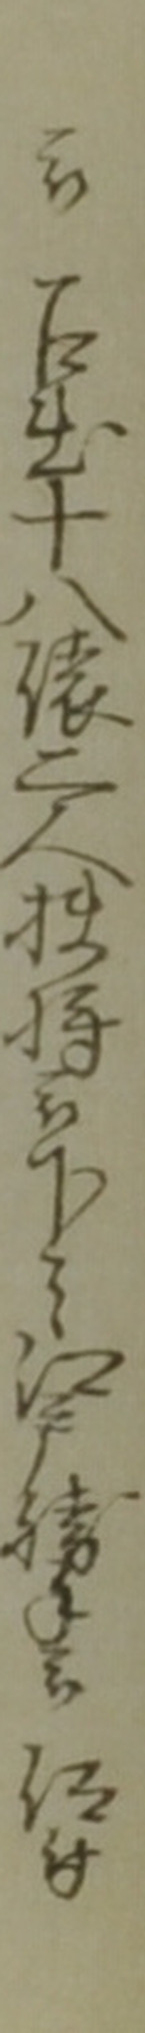被召出十八俵二人扶持被下之江戸勝手被仰付

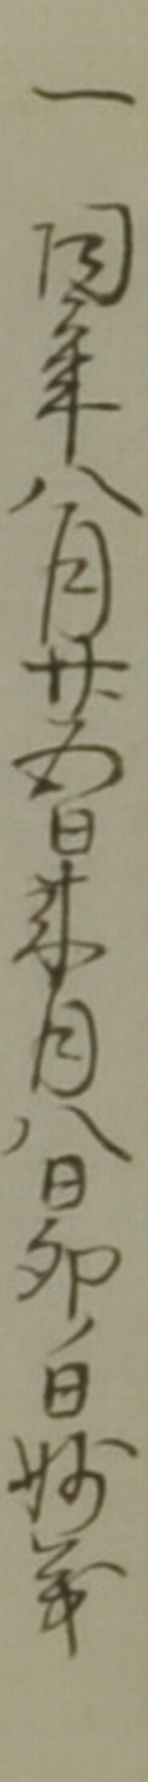一同年八月廿五日来月八日卯日妙義
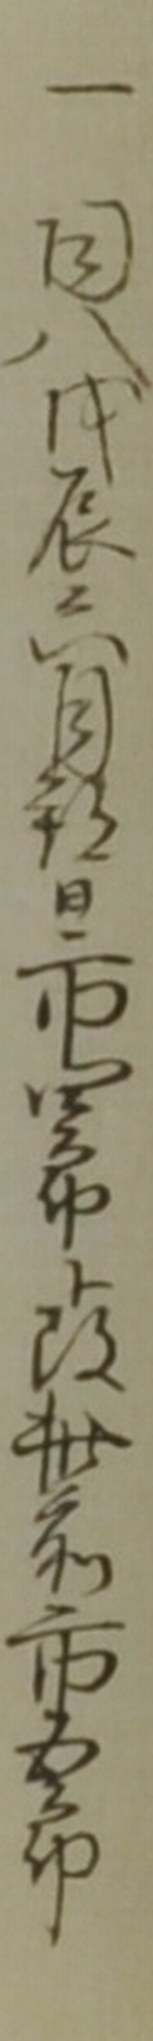一同八戊辰六月朔日市四郎改此前市五郎
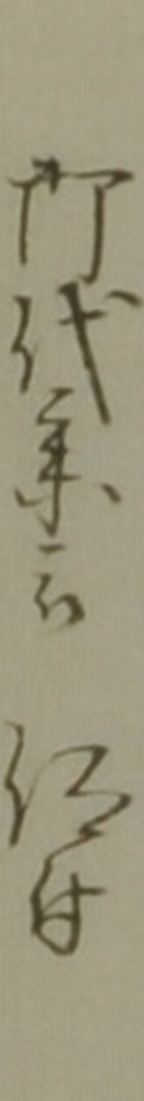御代参被仰付

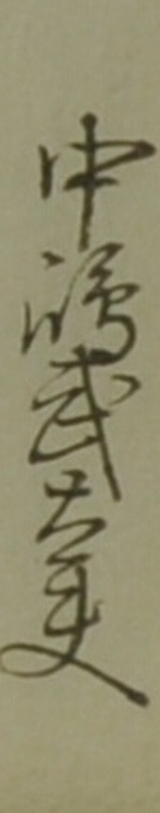中崎武太夫
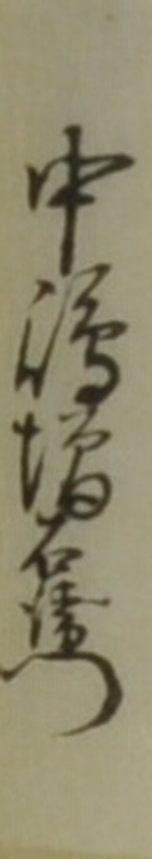中崎増右衛門

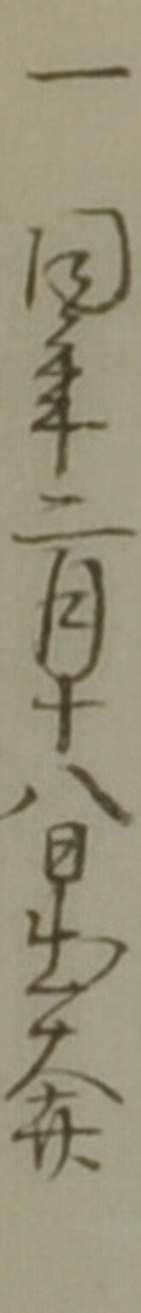一同年二月十八日出奔
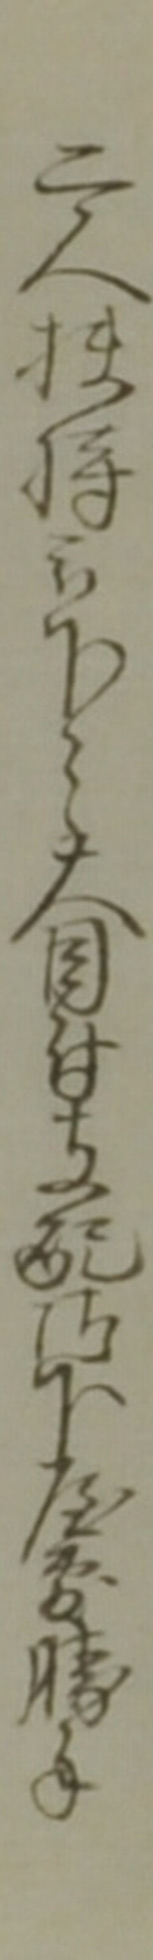二人扶持被下之大目付支配御下屋敷勝手
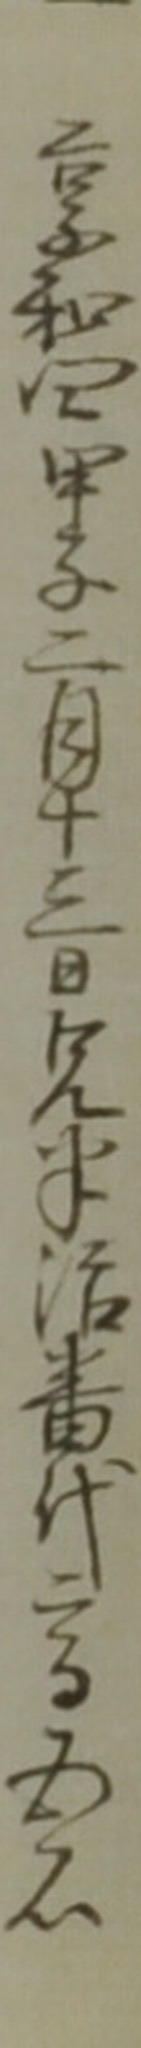一享和四甲子二月十三日兄半治番代高五石
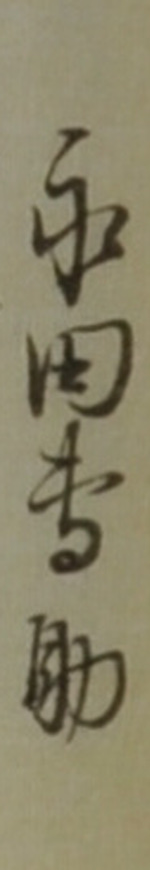永田専助
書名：無足廃家（弐）
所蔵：伊那市立高遠町図書館・合同会社AMANE
